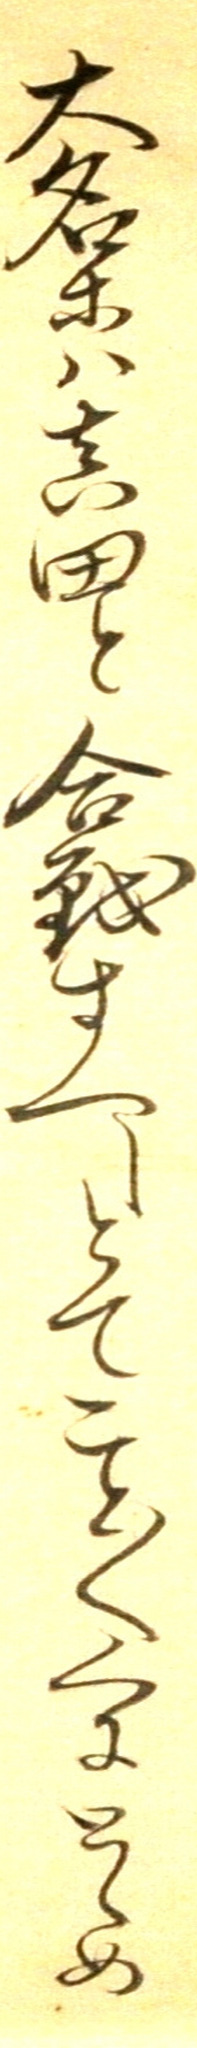大名等は真田と合戦すへしとてこと〳〵くにとゝめ
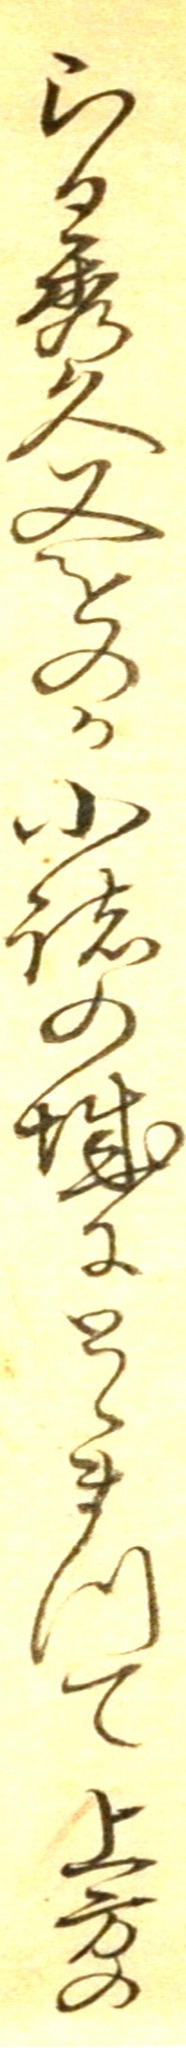らる秀久又をのか小諸の城にとゝまつて上方の
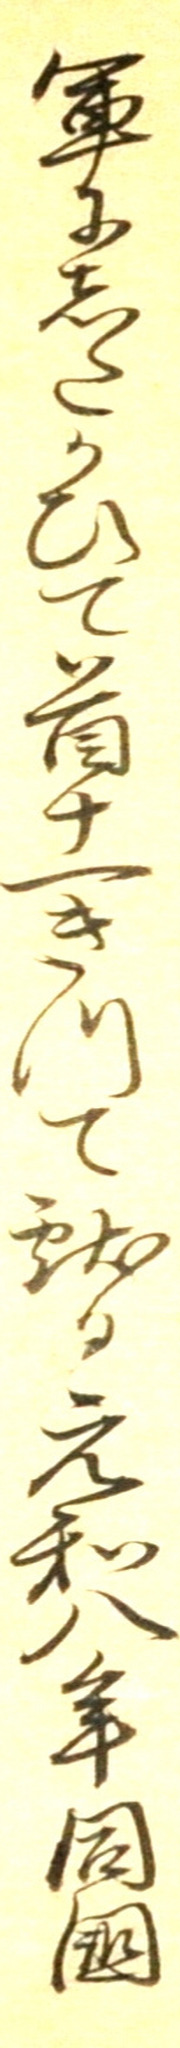軍にしたかひて首十一きつて献る元和八年同国
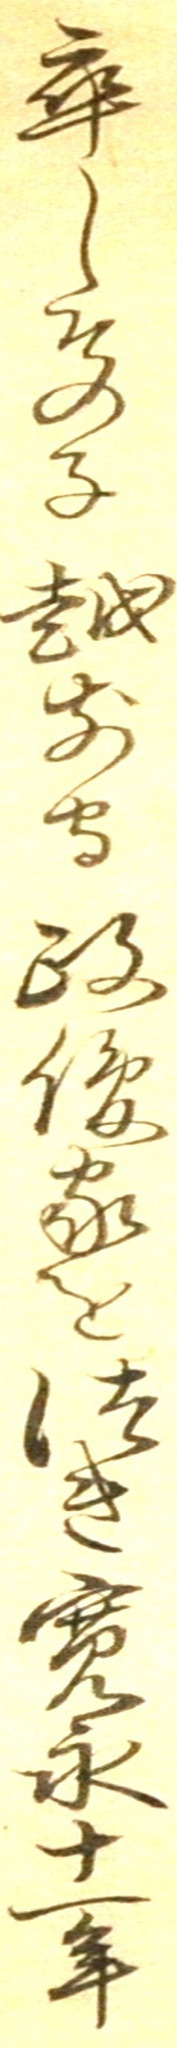卒しその子越前守政俊家をつき寛永十一年
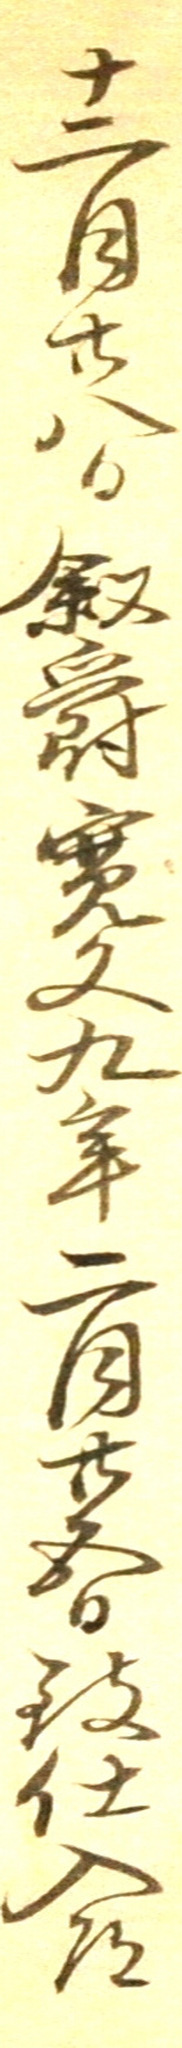十二月廿八日叙爵寛文九年二月廿五日致仕入道
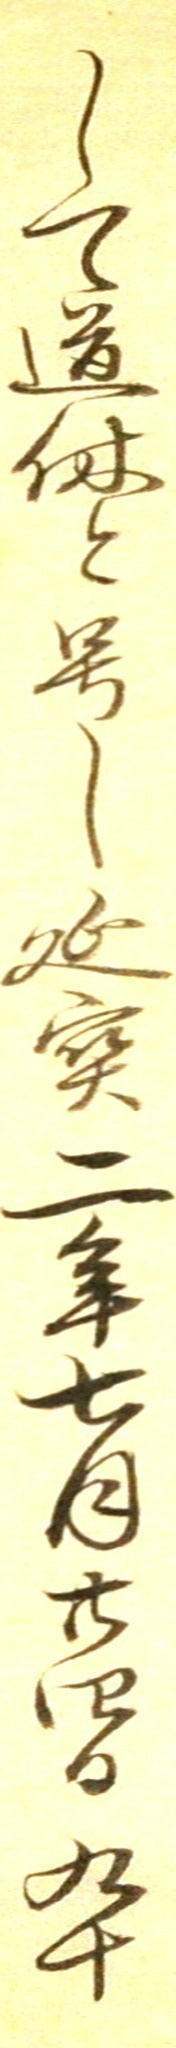して道休と号し延宝二年七月廿四日九十
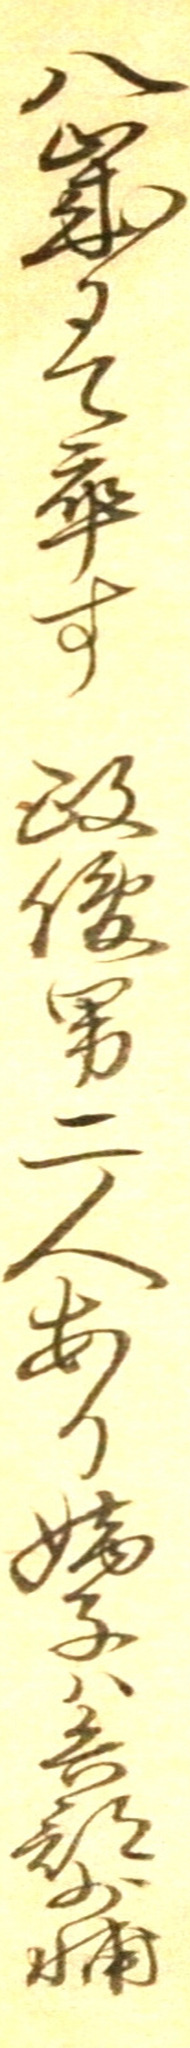八歳にて卒す政俊男二人あり嫡子は兵部少輔
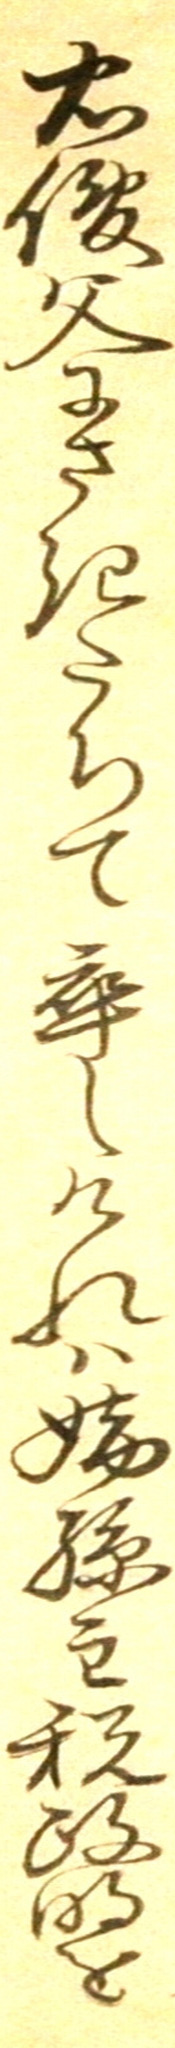忠俊父にさきたちて卒しけれは嫡孫主税政明を
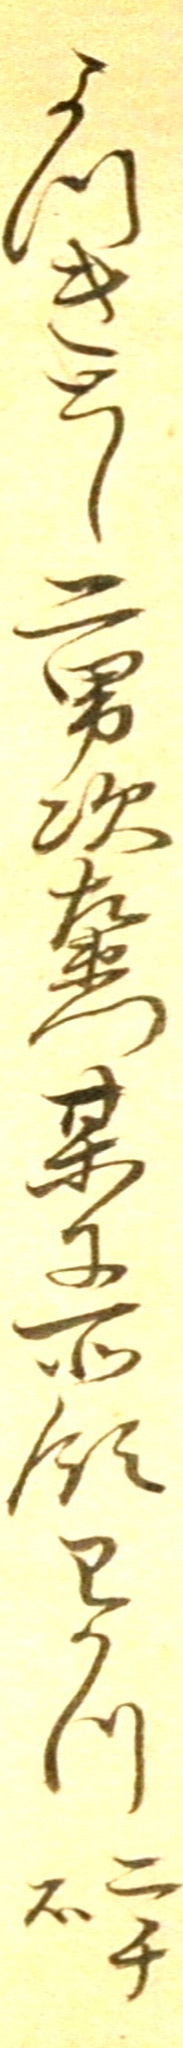よつきとし二男次左衛門某に所領わかつ二千石

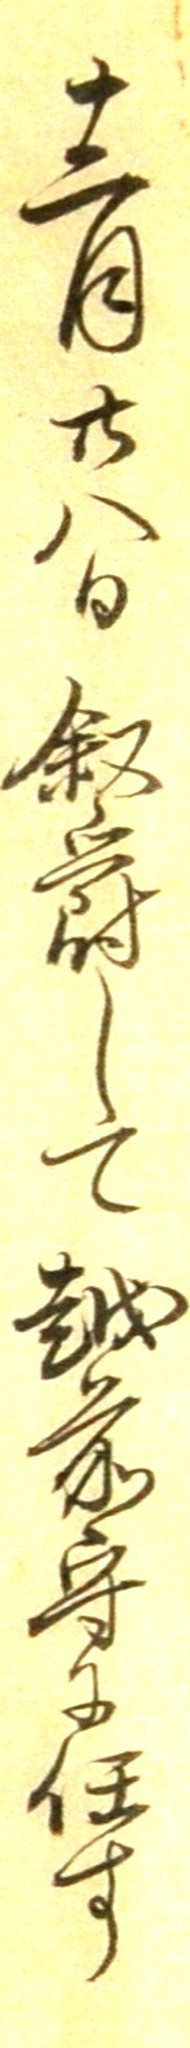十二月廿八日叙爵して越前守に任す
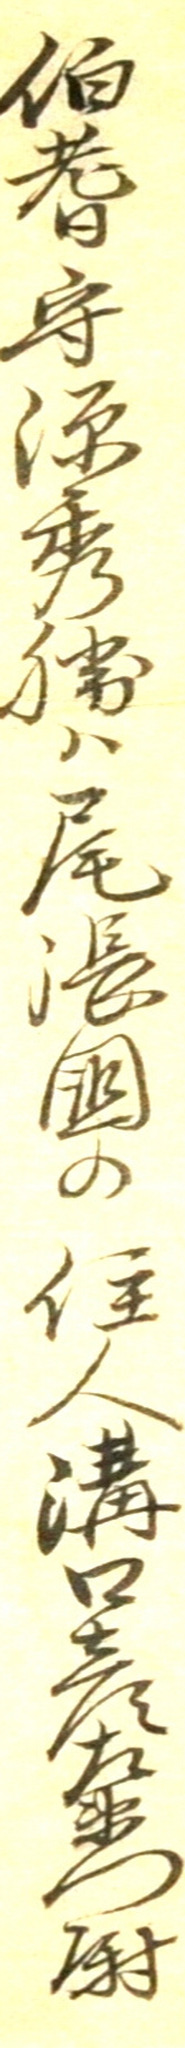伯耆守源秀勝は尾張国の住人溝口彦左衛門尉
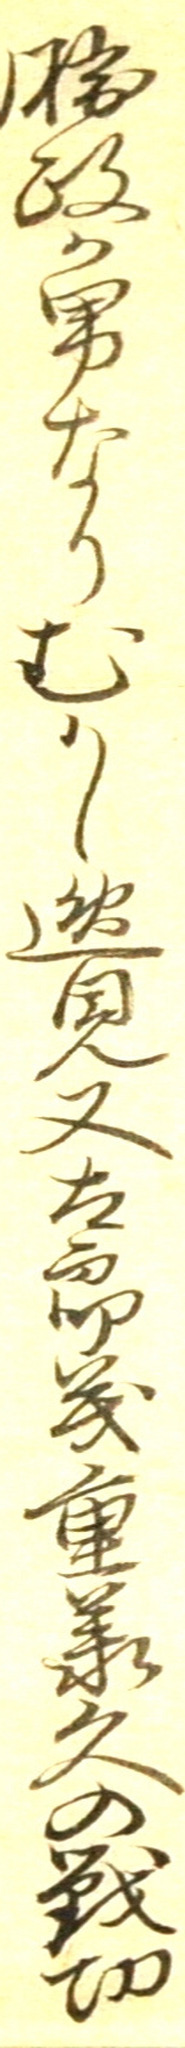勝政か男なりむかし逸見又太郎義重承久の戦功
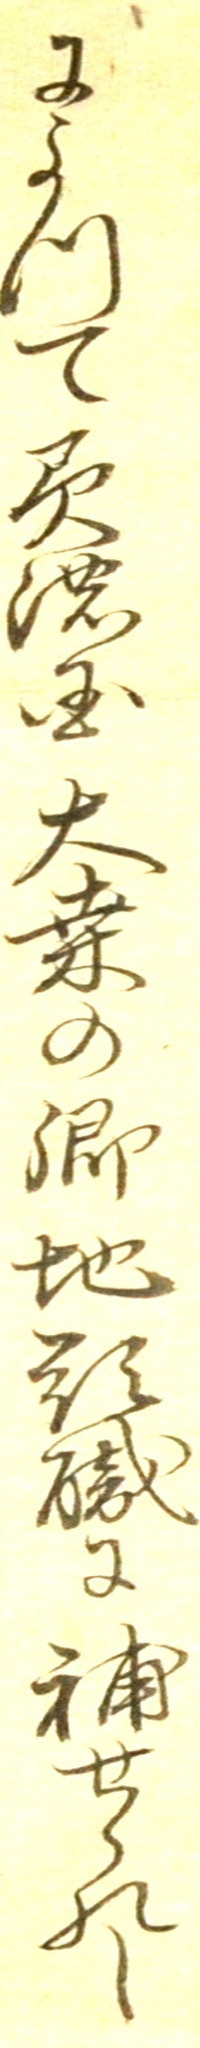によつて美濃国大桑の郷地頭職に補せられし
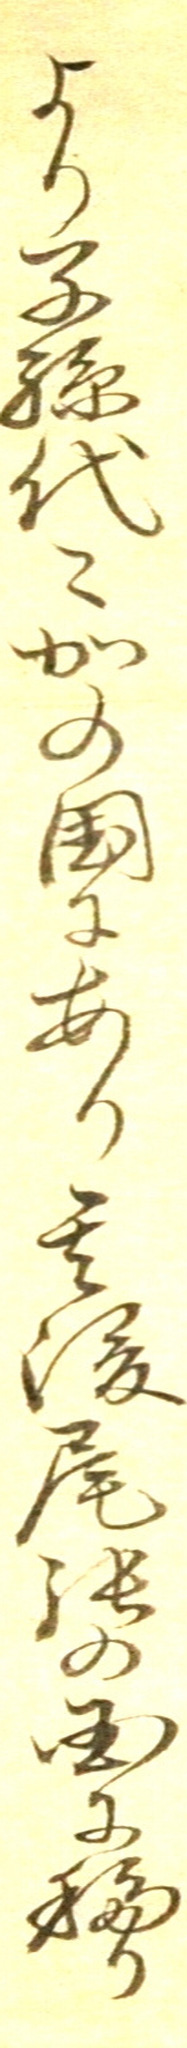より子孫代々かの国にあり其後尾張の国に移り
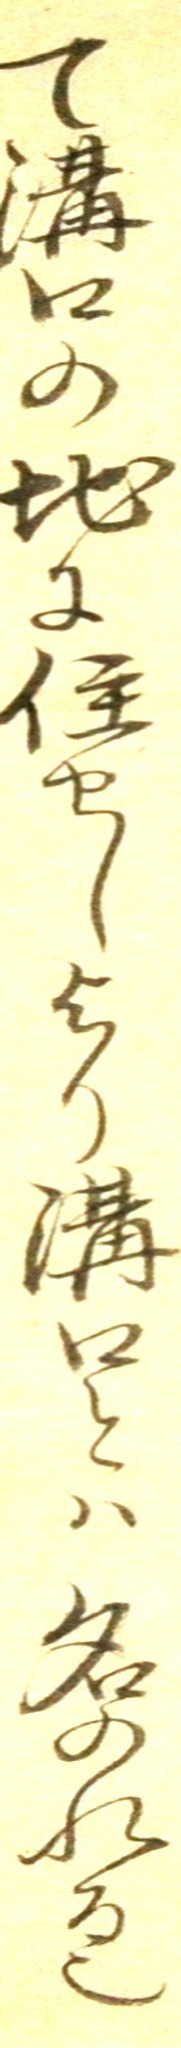て溝口の地に住せしより溝口とは名のれる也
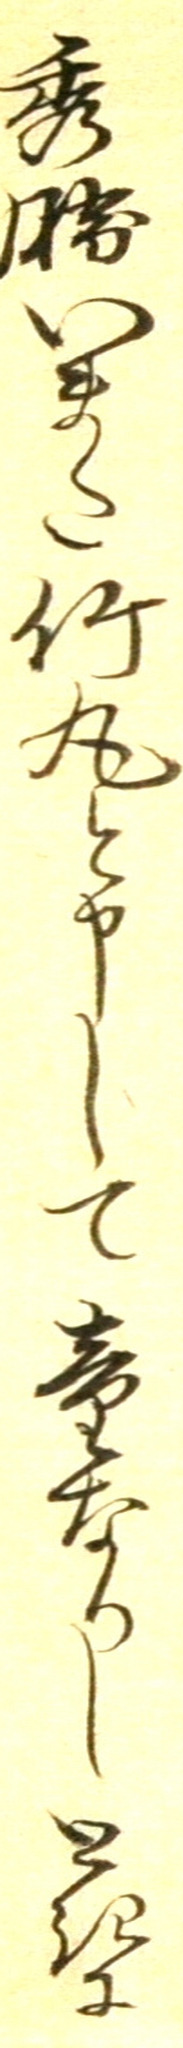秀勝いまた竹丸と申して童なりしときに
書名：藩翰譜（九・上）
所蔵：伊那市立高遠町図書館・合同会社AMANE
